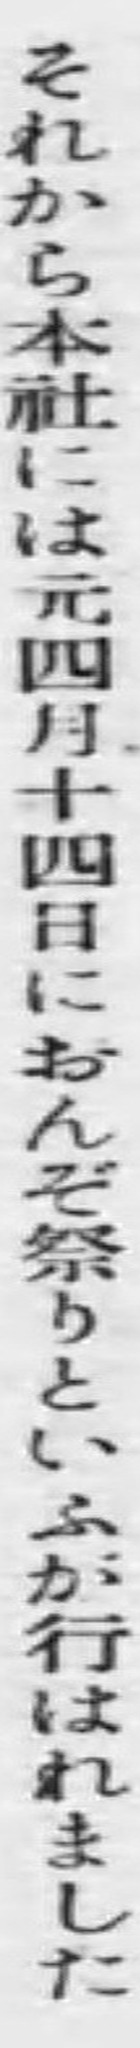それから本社には元四月十四日におんぞ祭りといふが行はれました
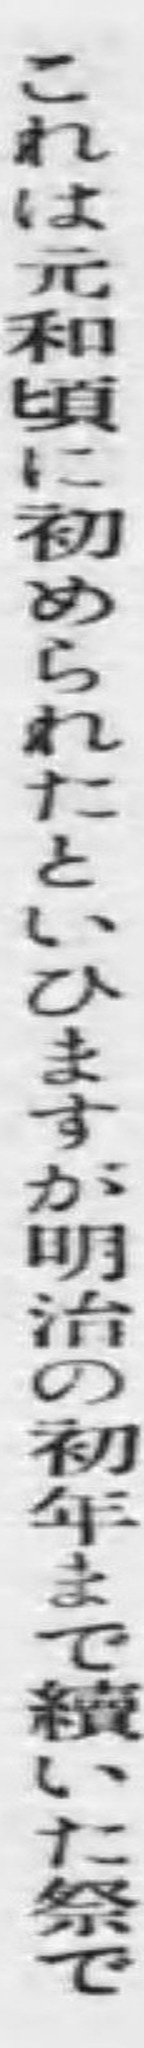これは元和頃に初められたといひますが明治の初年まで続いた祭で
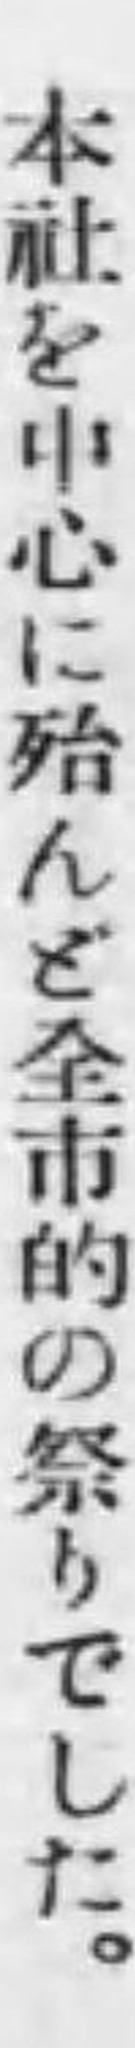本社を中心に殆んど全市的の祭りでした。
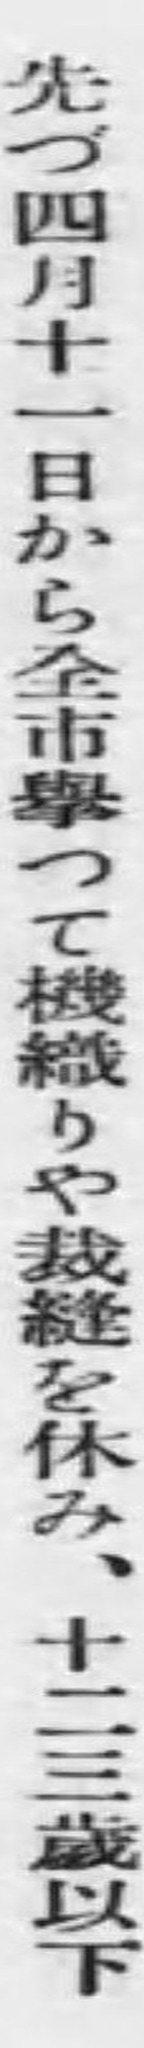先づ四月十一日から全市挙つて機織りや裁縫を休み、十二三歳以下
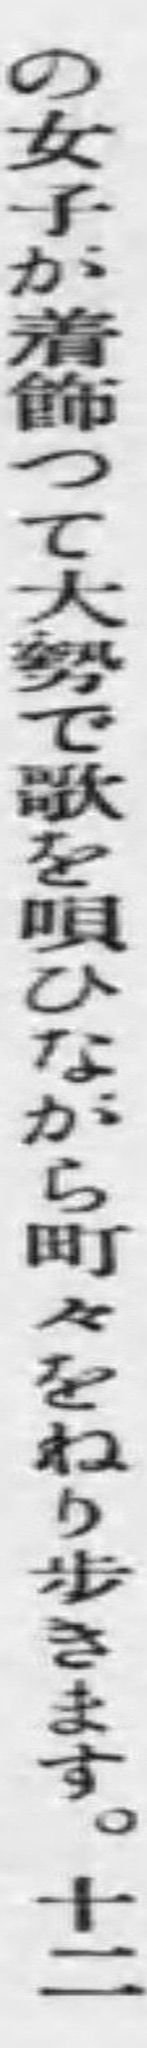の女子が着飾つて大勢で歌を唄ひながら町々をねり歩きます。十二
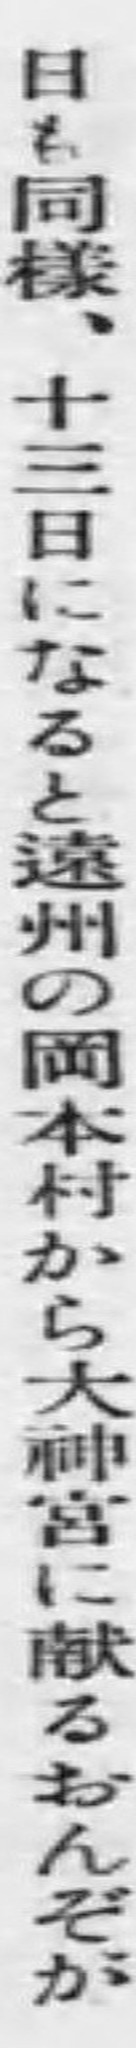日も同様、十三日になると遠州の岡本村から大神宮に献るおんぞが
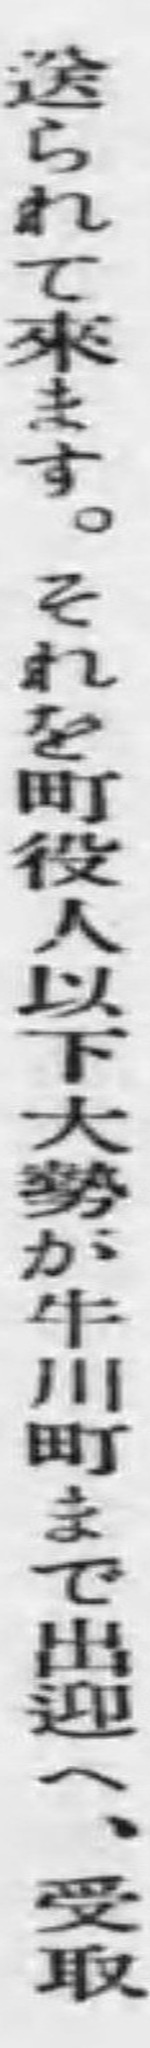送られて来ます。それを町役人以下大勢が牛川町まで出迎へ、受取
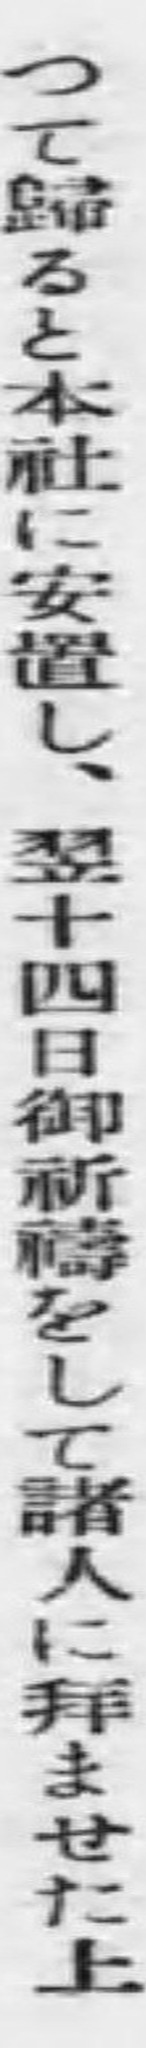つて帰ると本社に安置し、翌十四日御祈祷をして諸人に拝ませた上
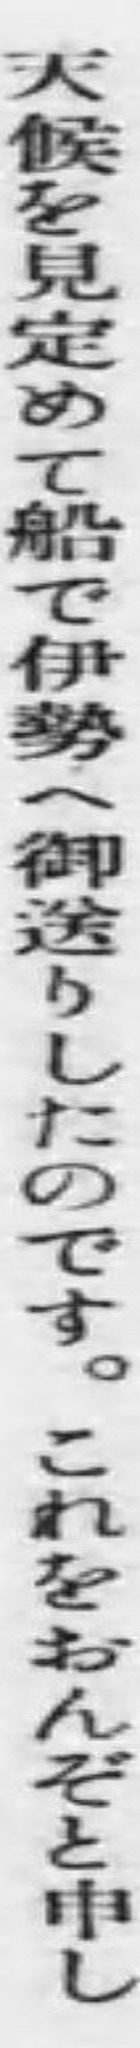天候を見定めて船で伊勢へ御送りしたのです。これをおんぞと申し
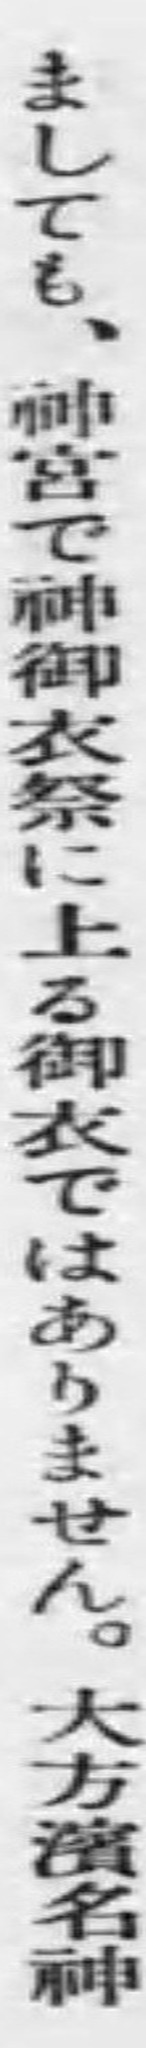ましても、神宮で神御衣祭に上る御衣ではありません。大方浜名神

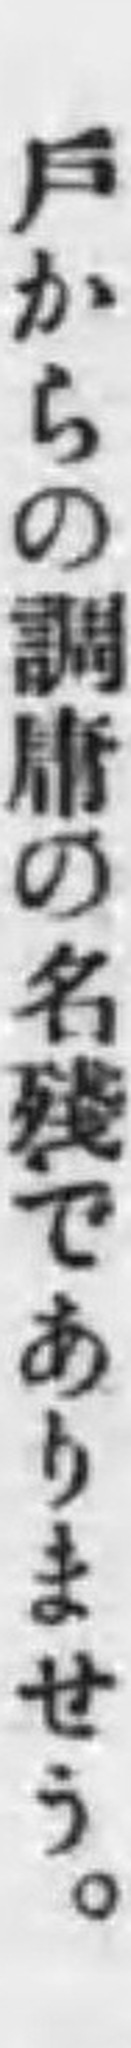戸からの調庸の名残でありませう。
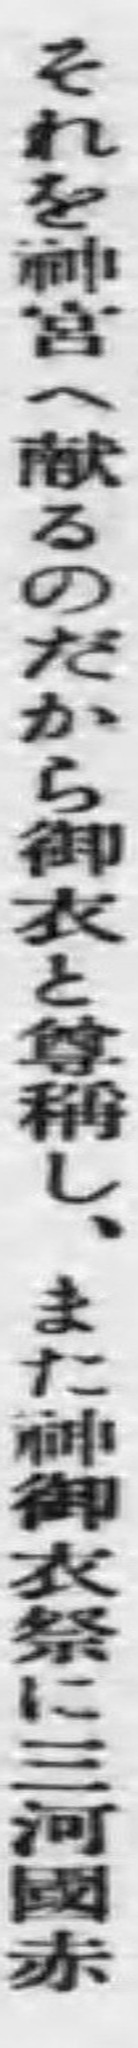それを神宮へ献るのだから御衣と尊称し、また神御衣祭に三河国赤
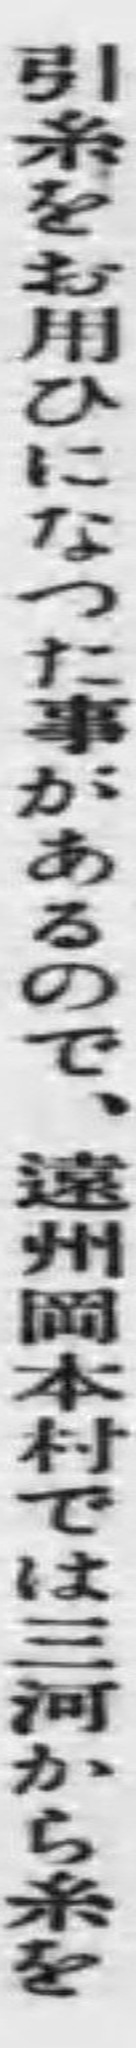引糸をお用ひになつた事があるので、遠州岡本村では三河から糸を
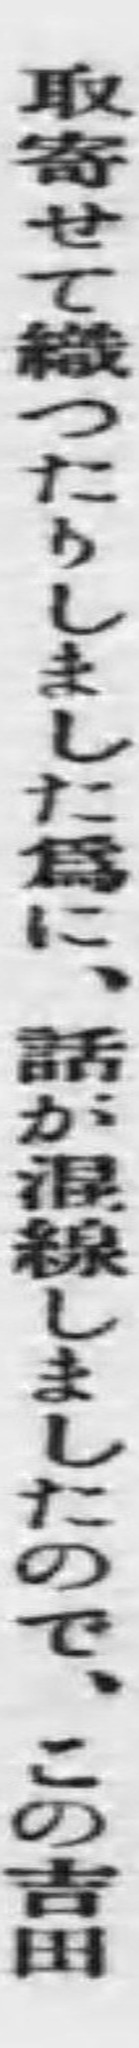取寄せて織つたりしました為に、話が混線しましたので、この吉田
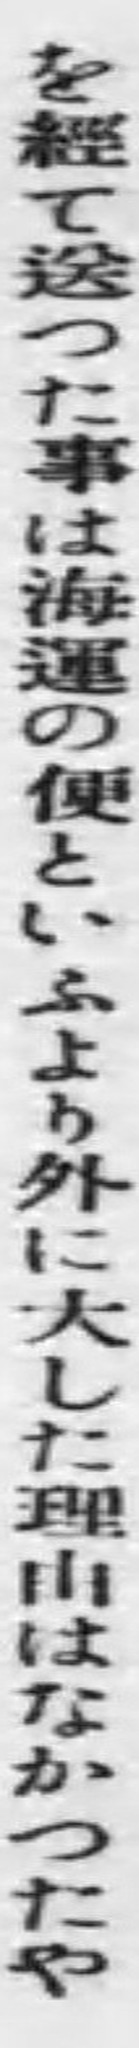を経て送つた事は海運の便といふより外に大した理由はなかつたや
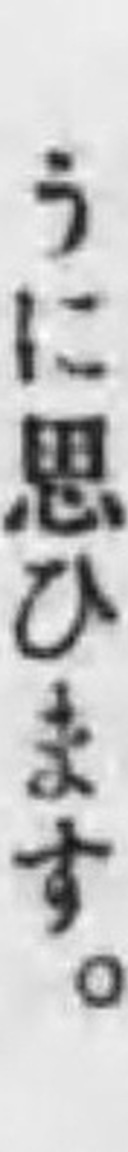うに思ひます。
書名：東三河道中記 : 豊橋市及其附近案内
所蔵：国立国会図書館 National Diet Library, JAPAN
